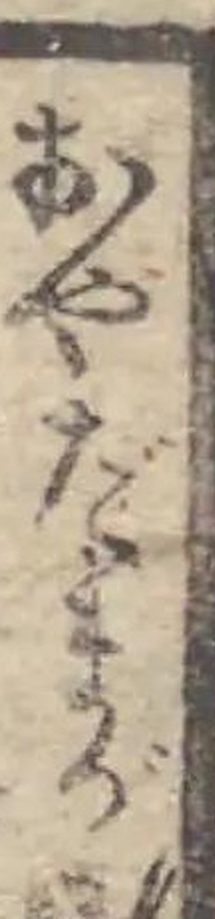おやだまが
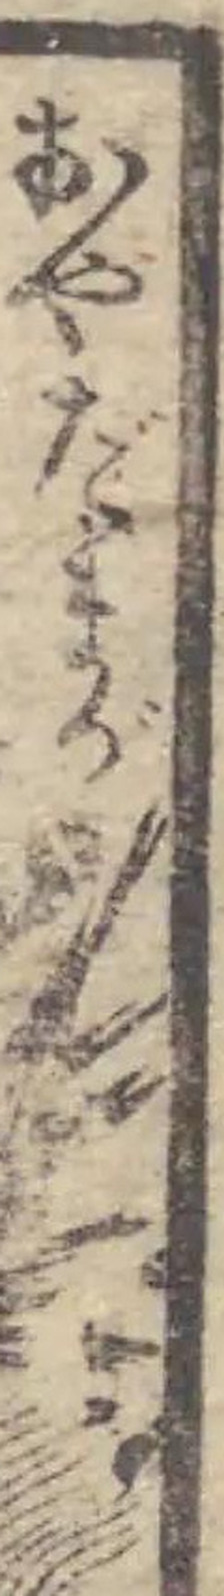おやだまが
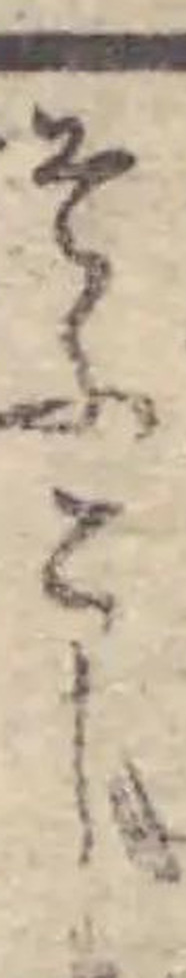そふこし
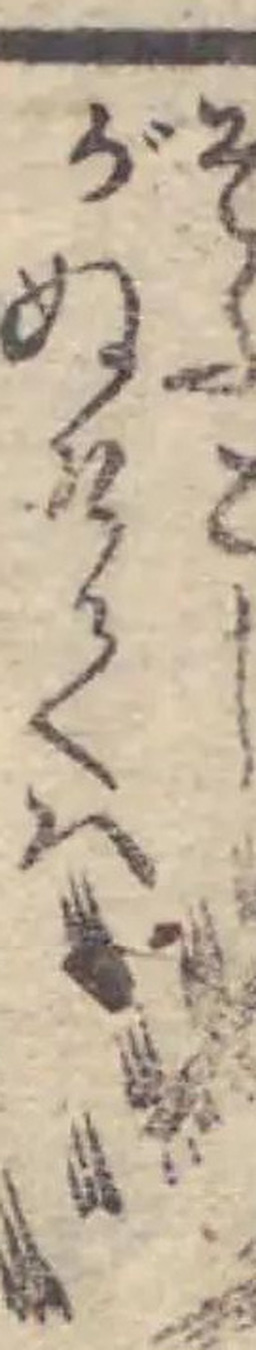がぬけては
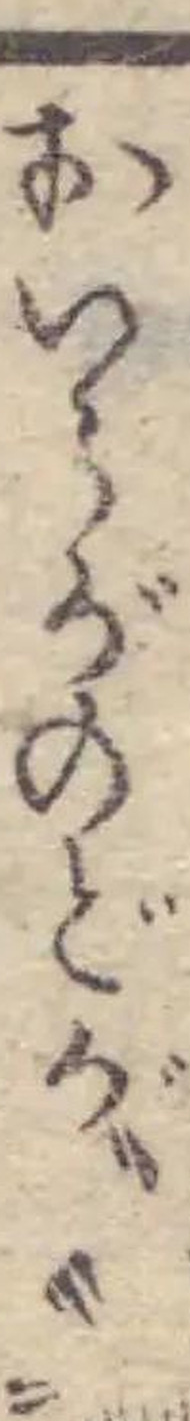おいらがのどが
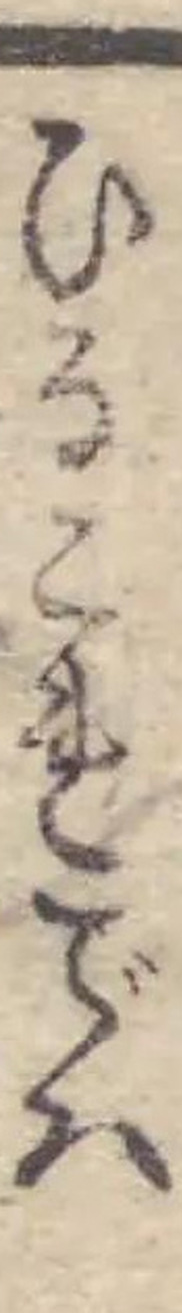ひるこれでは
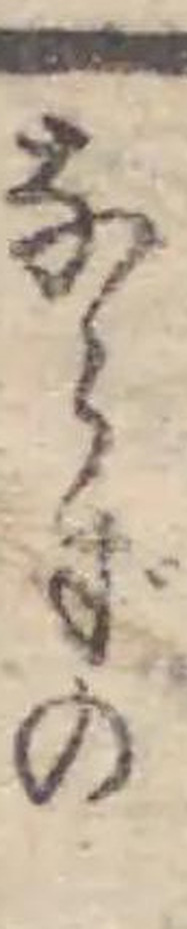ならずの
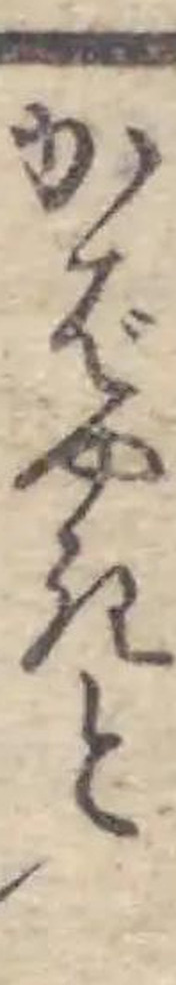かばやきと
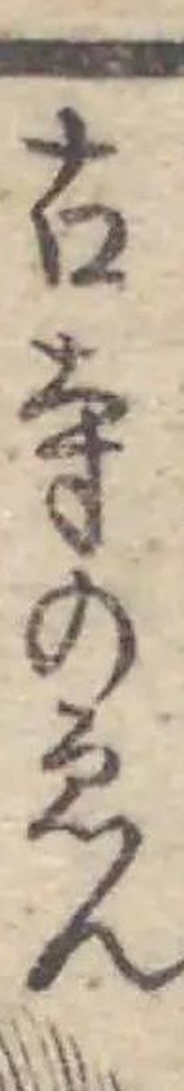古寺のゑん
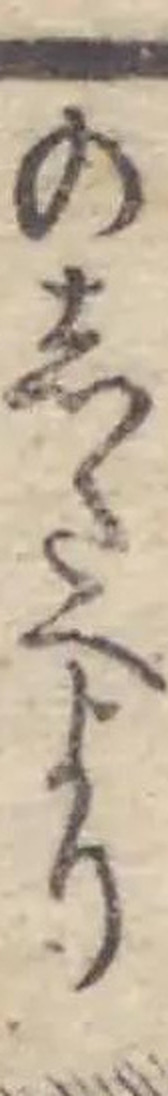のしたへより
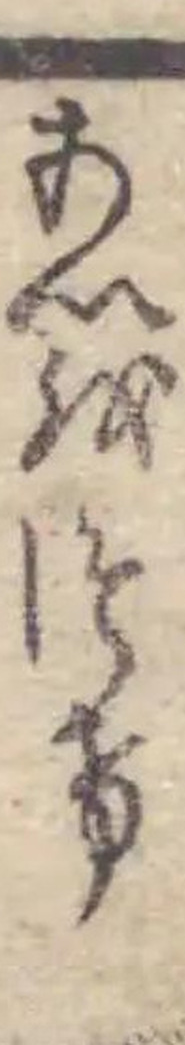あいをつけ
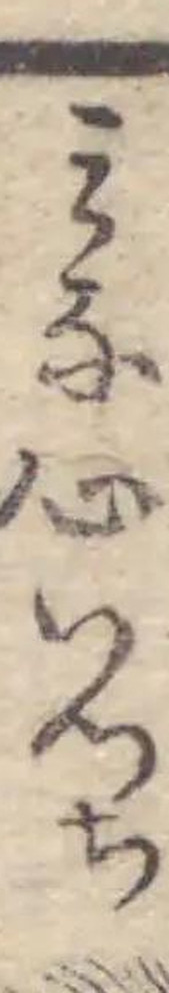みな心いつち
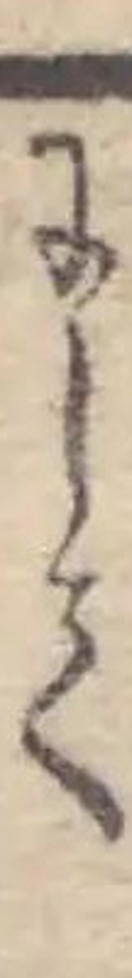にして
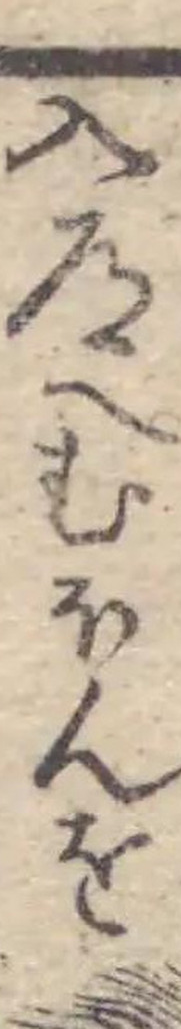入道へむほんを
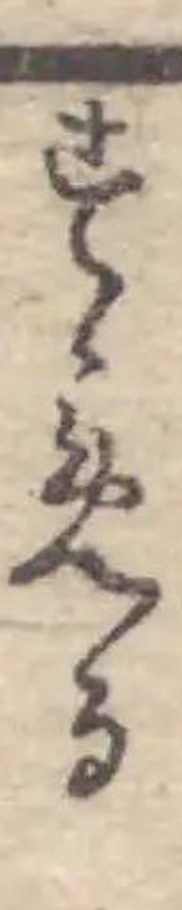すゝめる

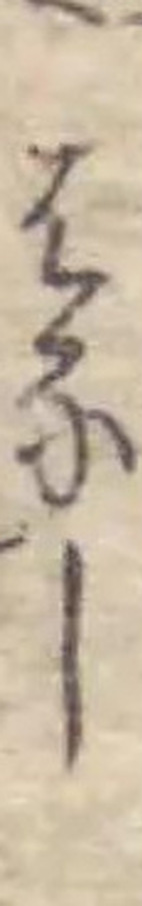はなし
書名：作意妖恐懼感心 2巻
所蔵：国立国会図書館 National Diet Library, JAPAN
